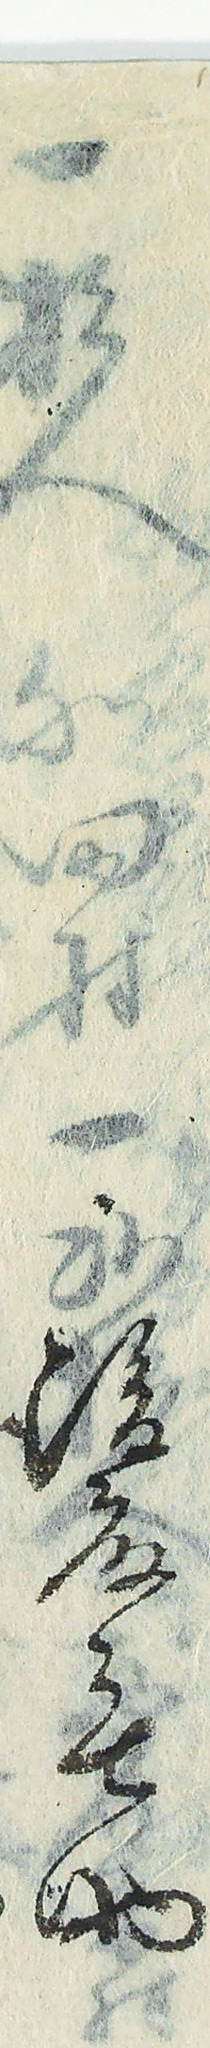後藤庄助
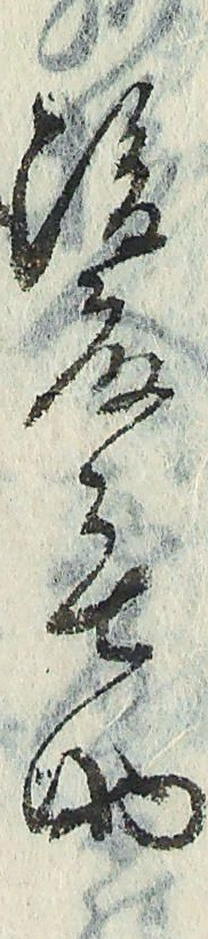後藤庄助
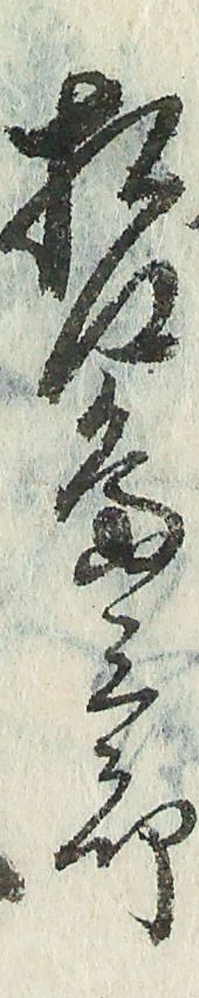松江島三郎
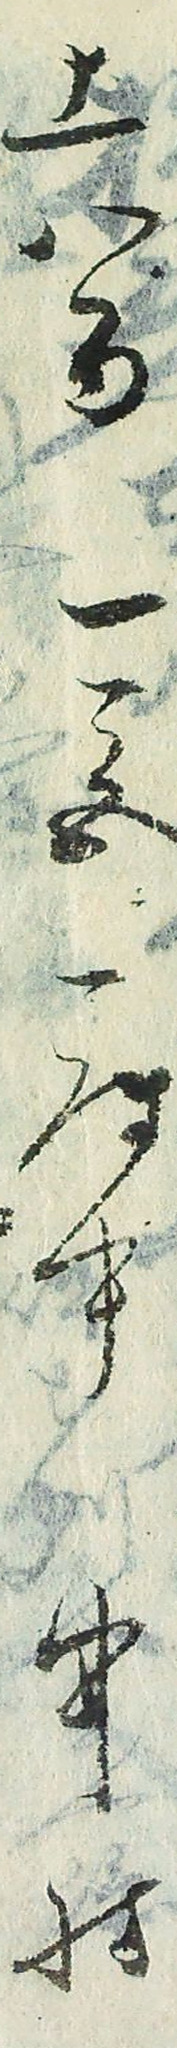上八万一宮府中中村
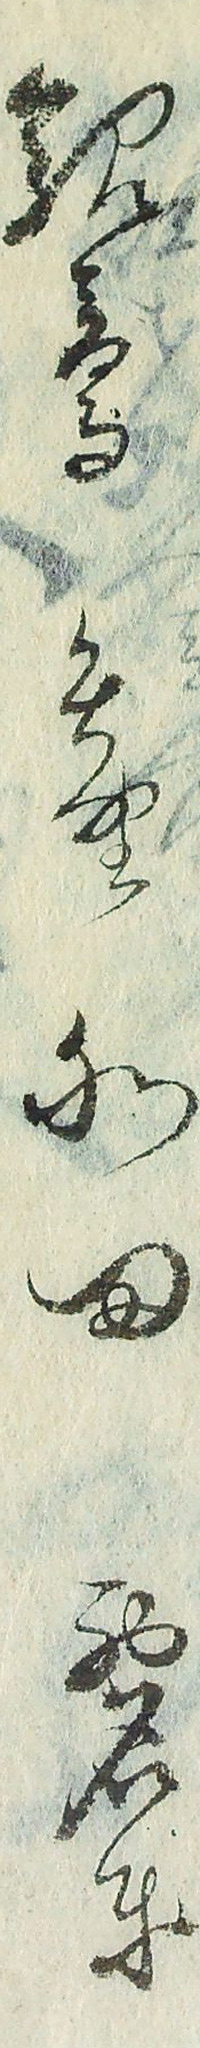観音寺矢野和田西名東
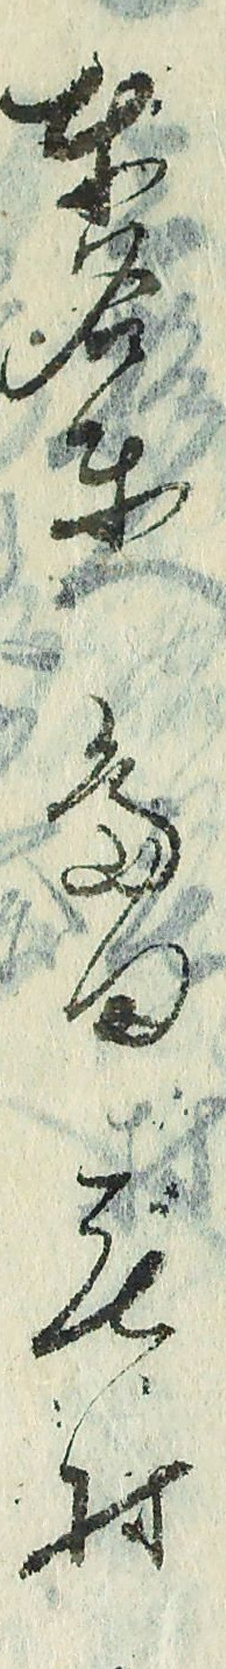東名東島田庄村
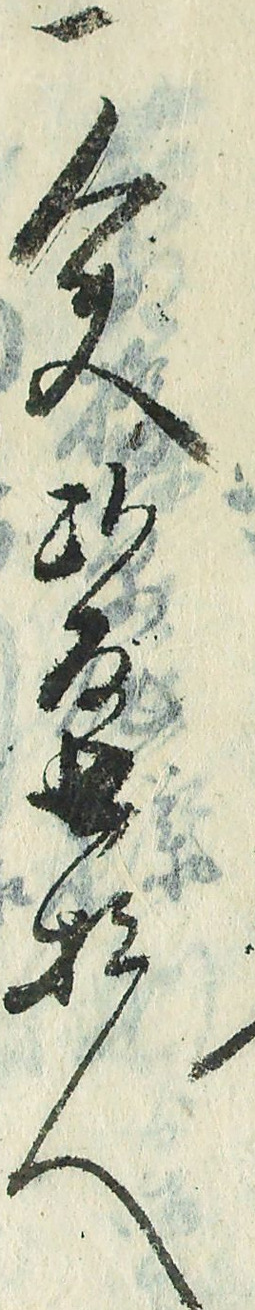一人夫弐百七拾人
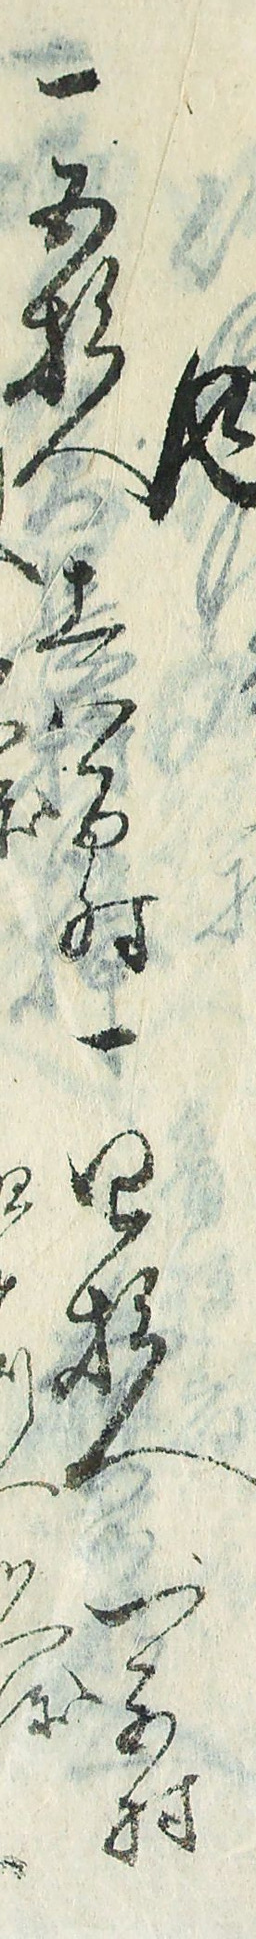一五拾人上八万村一四拾人一宮村
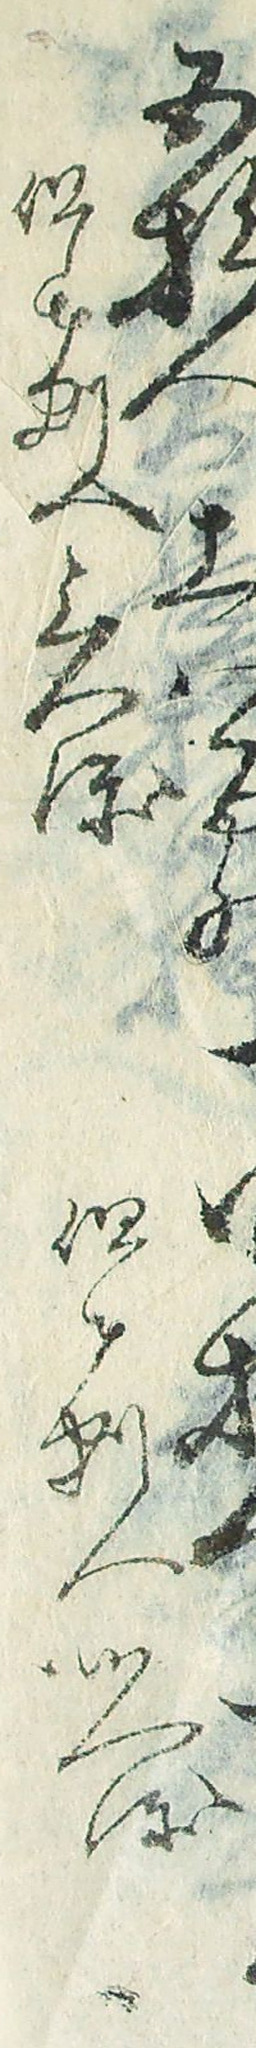但し才判人三人添但才判人弐人添

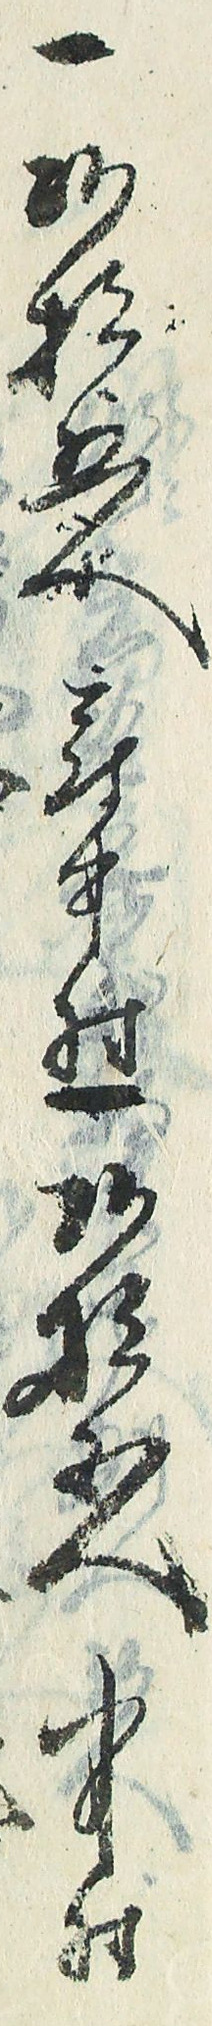一弐拾五人府中村一弐拾五人中村
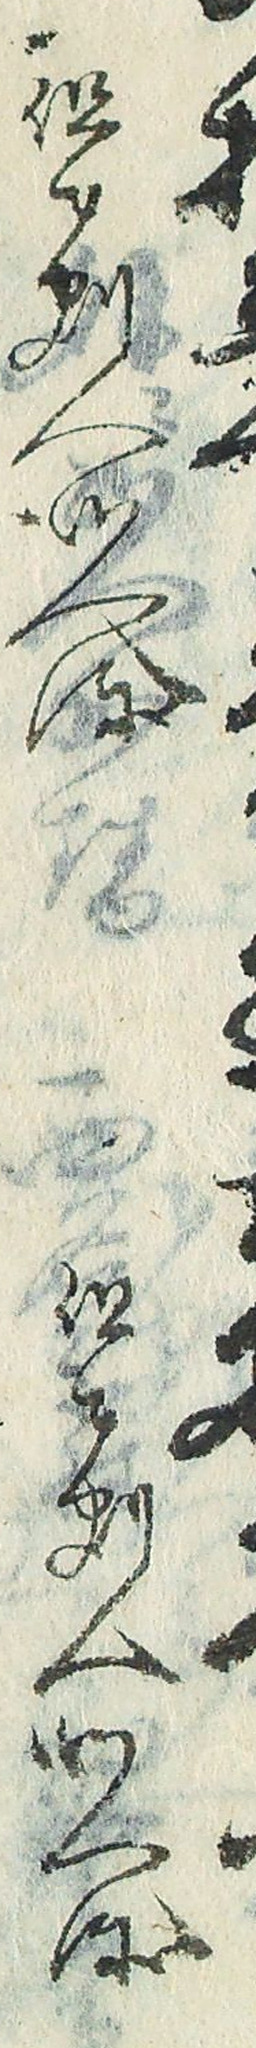但才判人弐人添但才判人弐人添
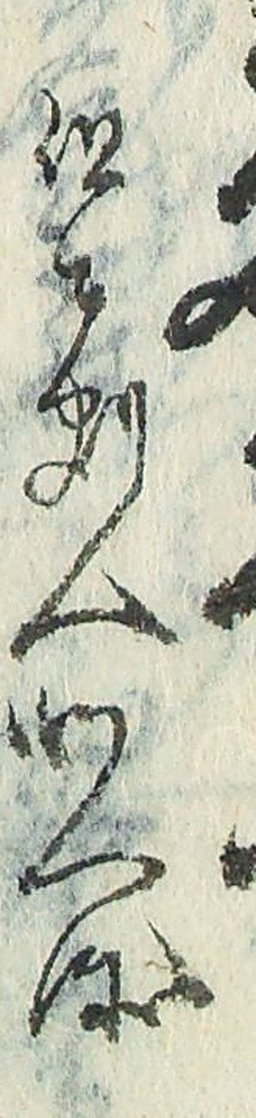但才判人弐人添
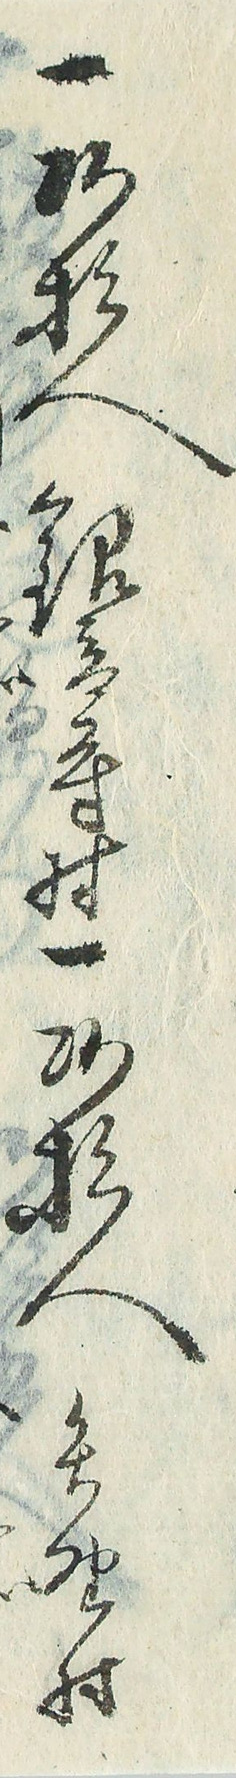一弐拾人観音寺村一弐拾人矢野村
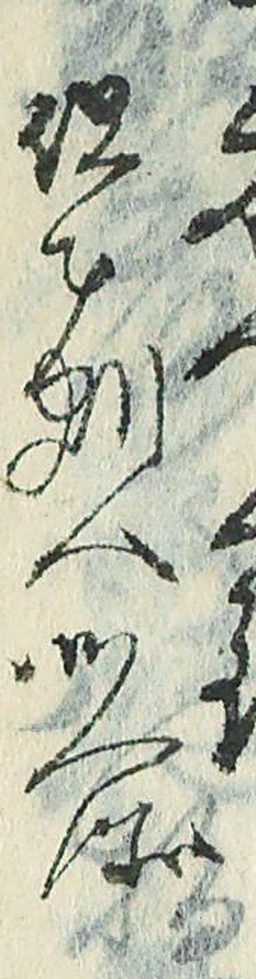但才判人弐人添
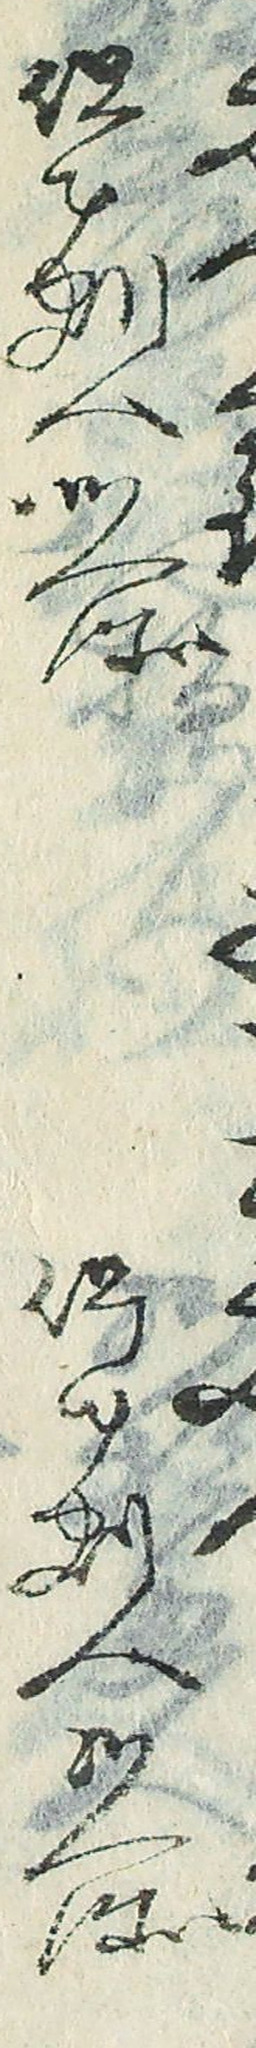但才判人弐人添但才判人弐人添
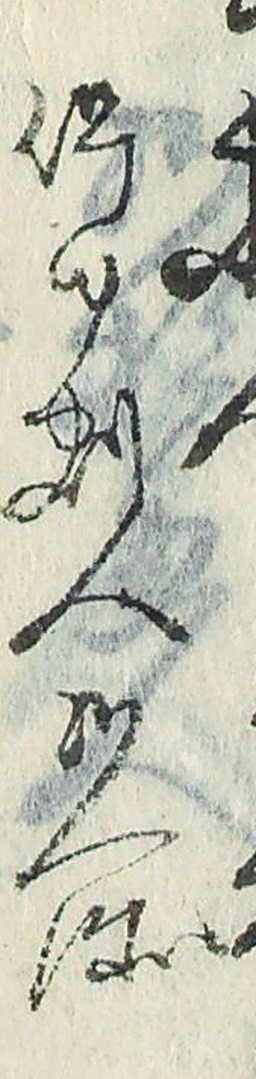但才判人弐人添
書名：公辺御役人為御廻浦御立越諸御用一巻
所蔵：鳴門教育大学 Naruto University of Education
